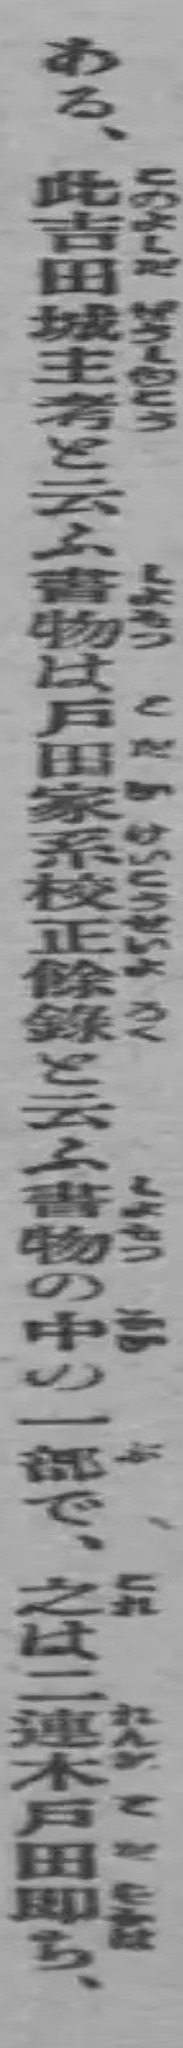ある、此吉田城主考と云ふ書物は戸田家系校正余録と云ふ書物の中の一部で、之は二連木戸田即ち、
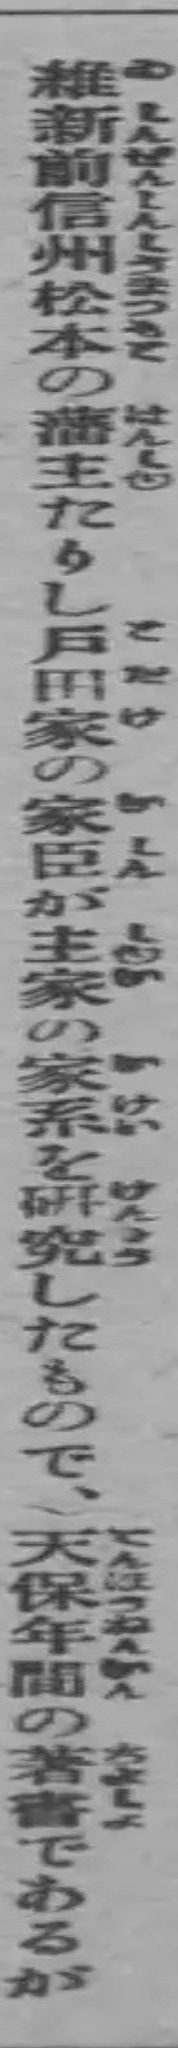維新前信州松本の藩主たりし戸田家の家臣が主家の家系を研究したもので、天保年間の著書であるが
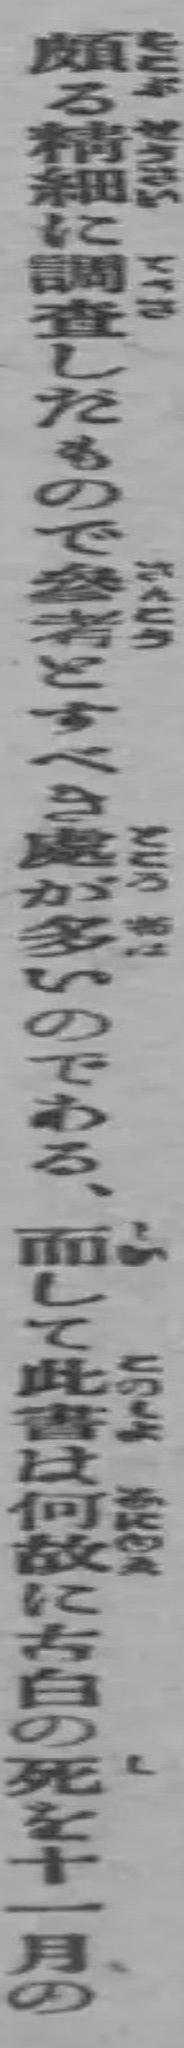頗る精細に調査したもので参考とすべき処が多いのである、而して此書は何故に古白の死を十一月の
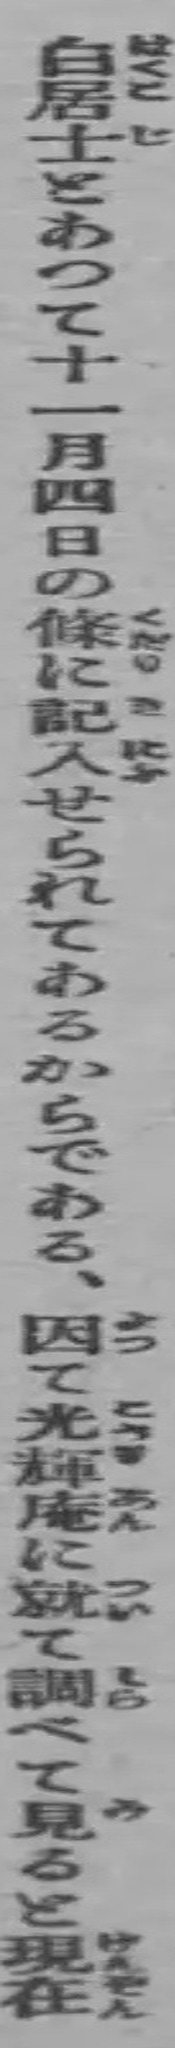白居士とあつて十一月四日の条に記入せられてあるからである、因て光輝庵に就て調べて見ると現在
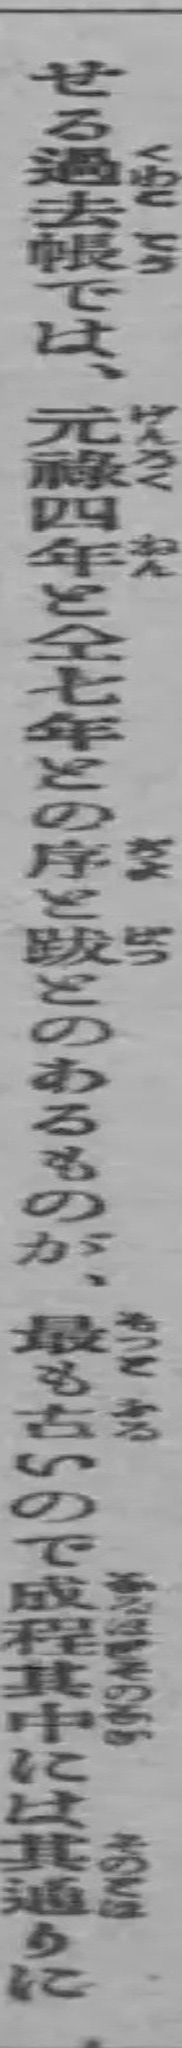せる過去帳では、元禄四年と仝七年との序と跋とのあるものが、最も古いので成程其中には其通りに
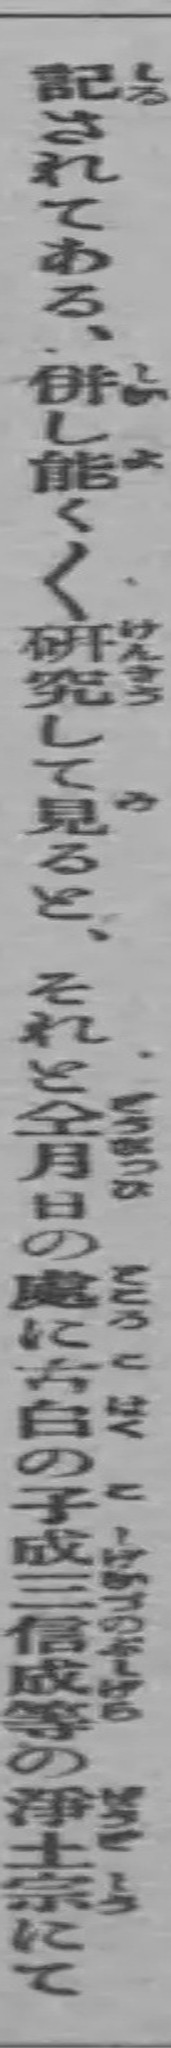記されてある、併し能く〳〵研究して見ると、それと仝月日の処に古白の子成三信成等の浄土宗にて
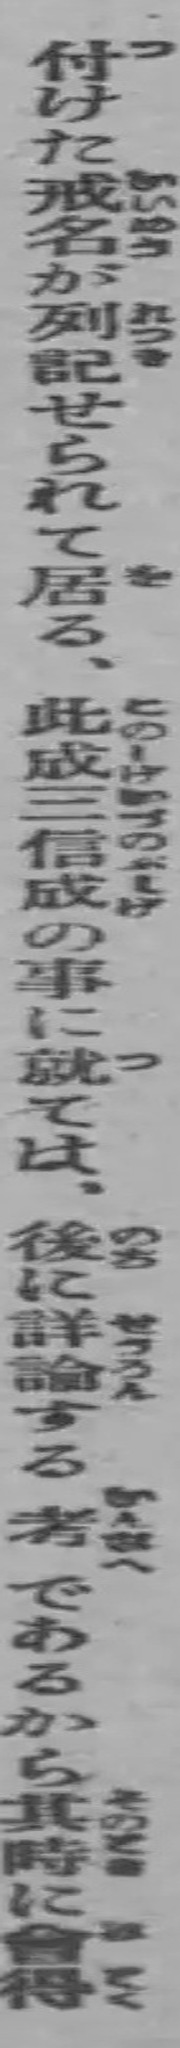付けた戒名が列記せられて居る、此成三信成の事に就ては、後に詳論する考であるから其時に会得
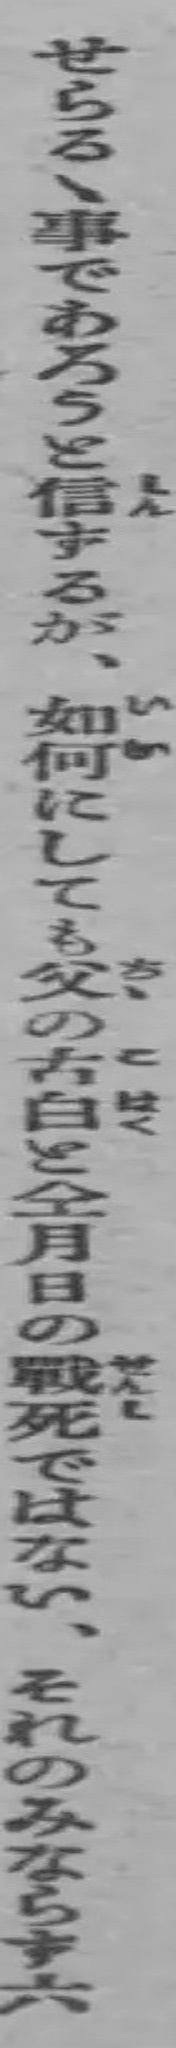せらるゝ事であろうと信ずるが、如何にしても父の古白と仝月日の戦死ではない、それのみならず六
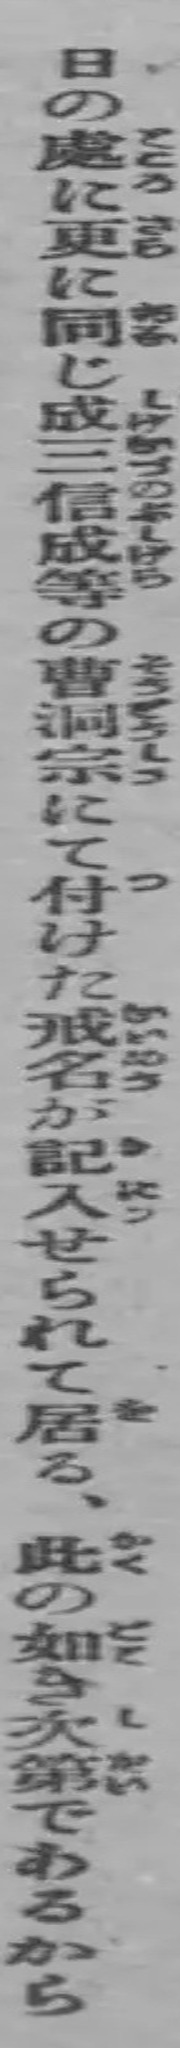日の処に更に同じ成三信成等の曹洞宗にて付けた戒名が記入せられて居る、此の如き次第であるから
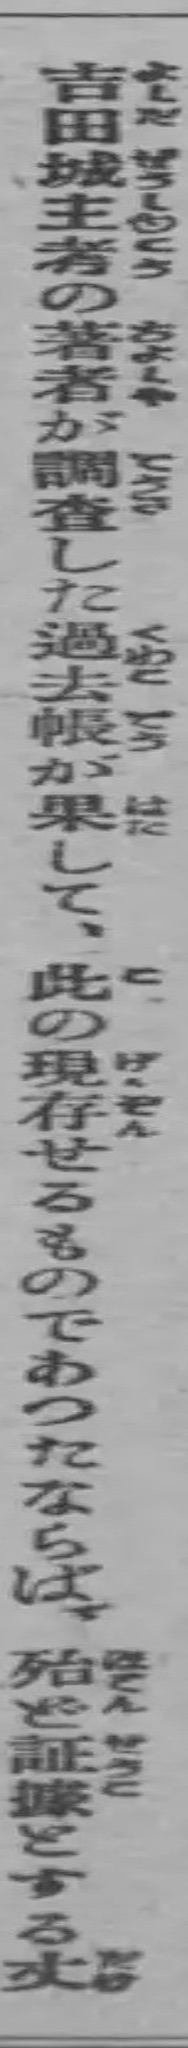吉田城主考の著者が調査した過去帳が果して、此の現存せるものであつたならば、殆ど証拠とする丈
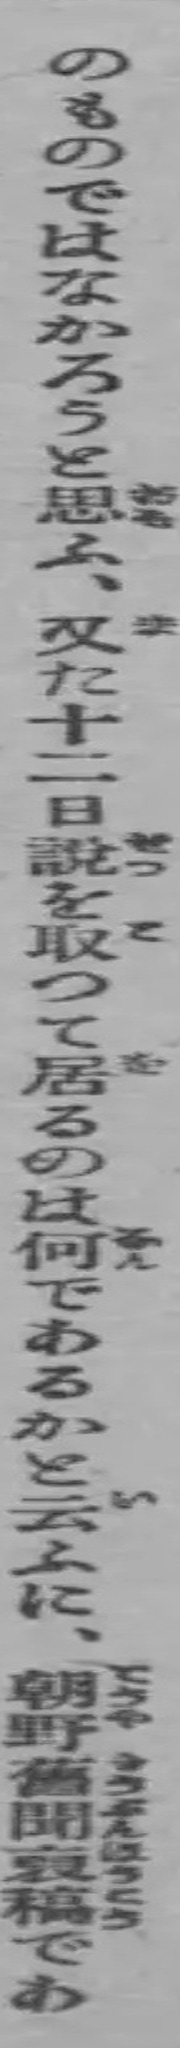のものではなかろうと思ふ、又た十二日説を取つて居るのは何であるかと云ふに、朝野旧聞裒稿であ
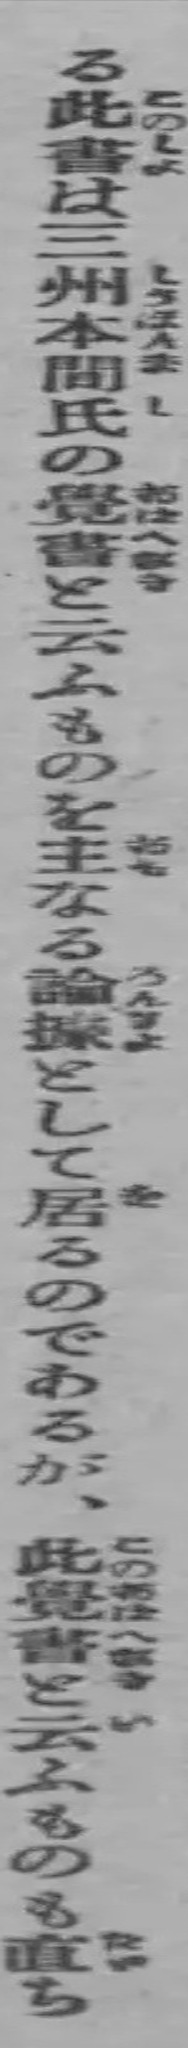る此書は三州本間氏の覚書と云ふものを主なる論拠として居るのであるが、此覚書と云ふものも直ち
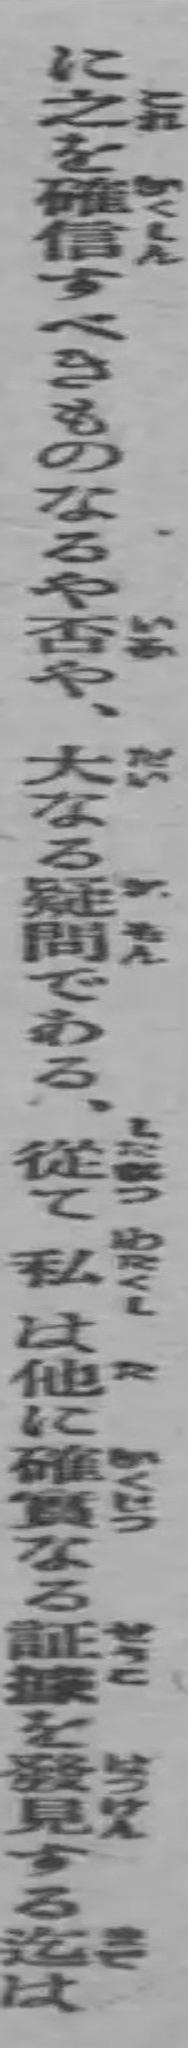に之を確信すべきものなるや否や、大なる疑問である、従て私は他に確実なる証拠を発見する迄は
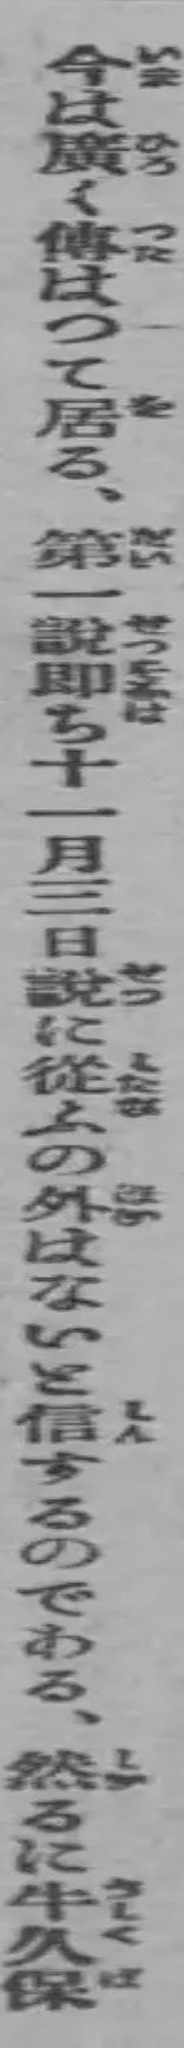今は広く伝はつて居る、第一説即ち十一月三日説に従ふの外はないと信するのである、然るに牛久保
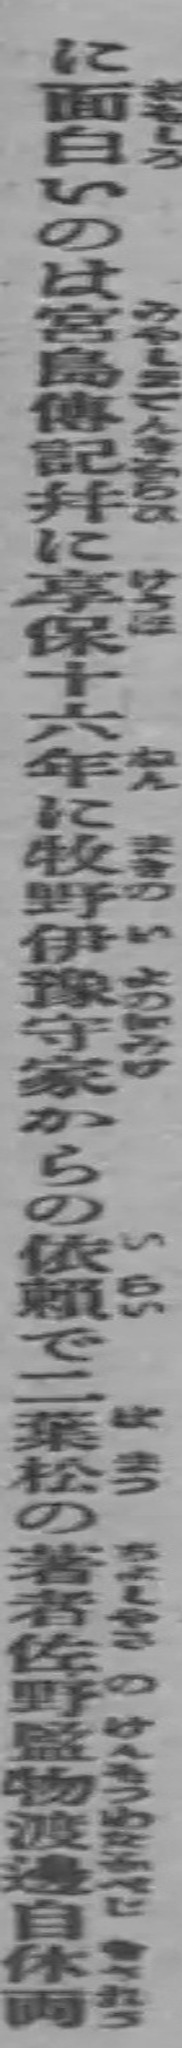に面白いのは宮島伝記幷に享保十六年に牧野伊予守家からの依頼でニ葉松の著者佐野監物渡邊自休両

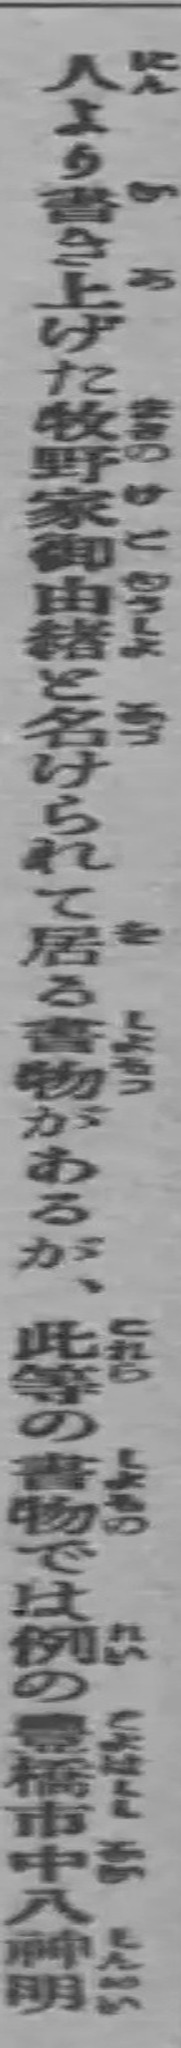人より書き上げた牧野家御由緒と名けられて居る書物があるが、此等の書物では例の豊橋市中八神明
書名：豊橋市史談
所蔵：国立国会図書館 National Diet Library, JAPAN
